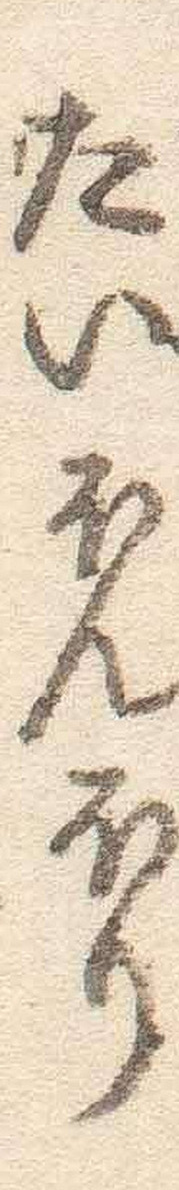たいほんほり
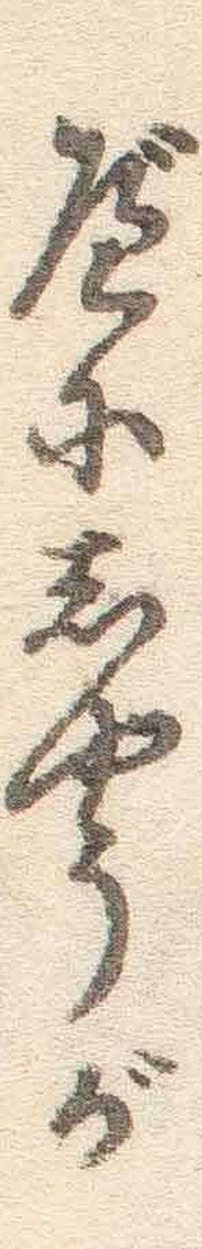べにしやうが
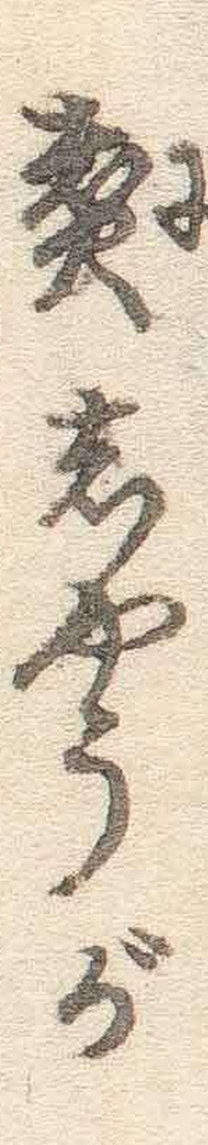煮しやうが
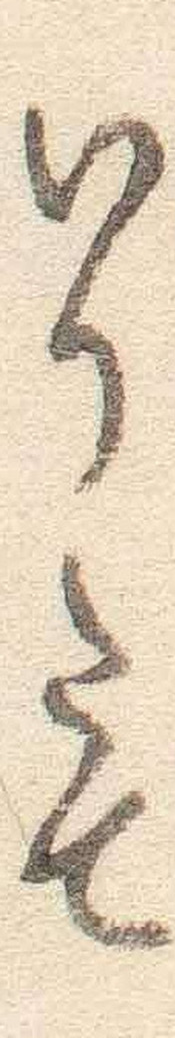いりたて
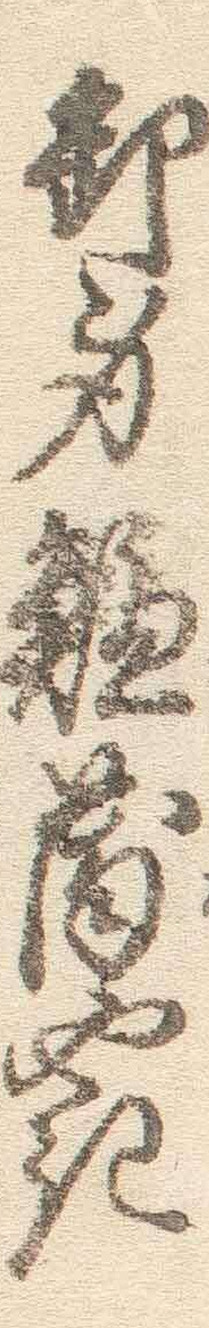卸身鱸蒲やき
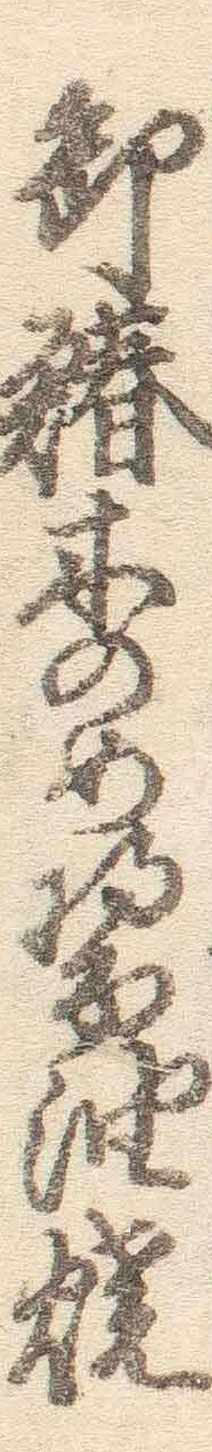卸鰆木のめ醤油焼
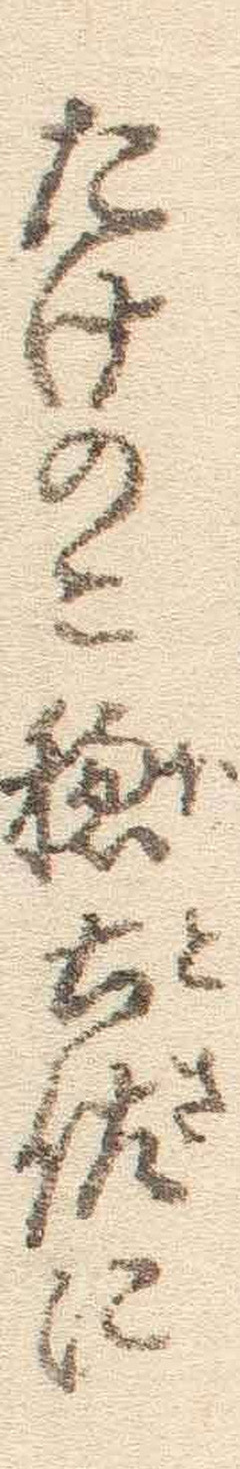たけのこ穂土佐に
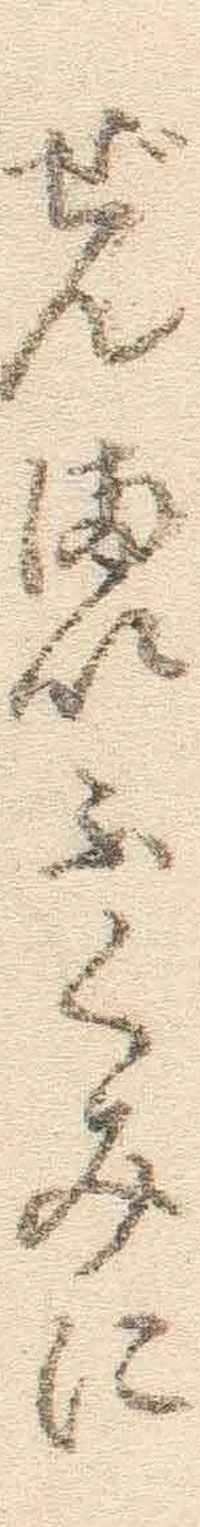ぜんまいふくみに
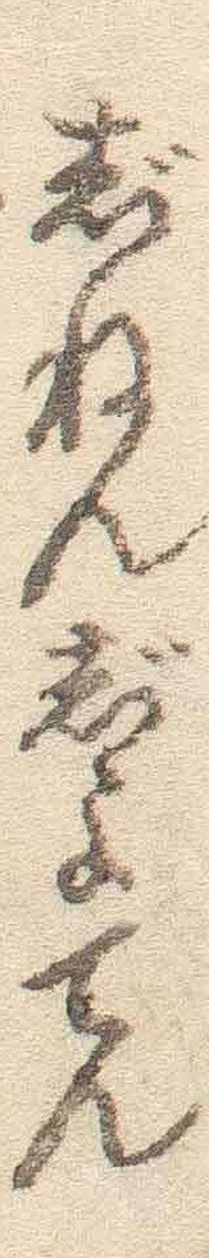じねんじよてん
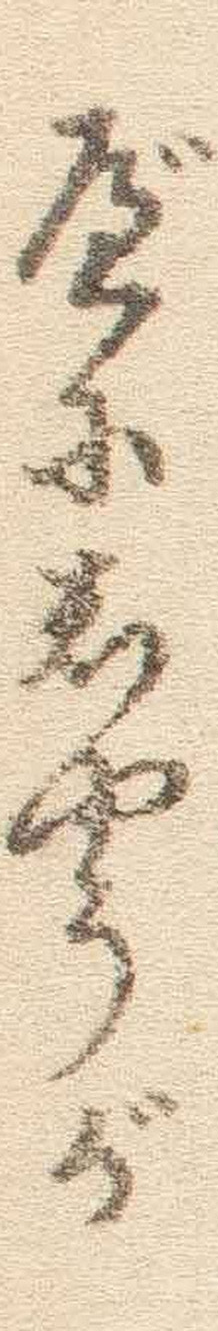べにしやうが
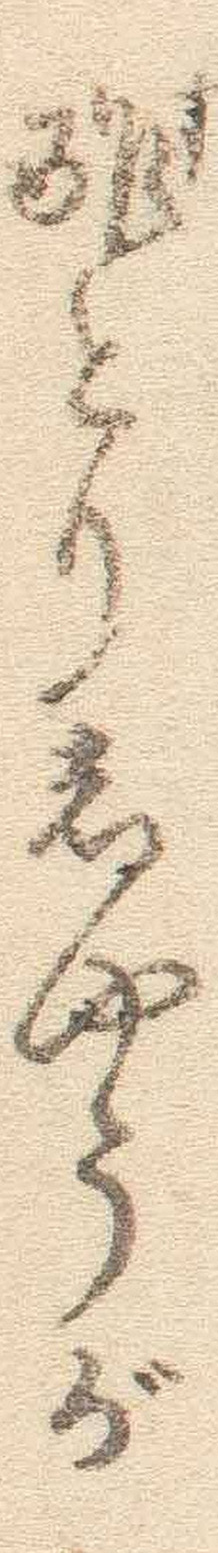酢とりしやうが
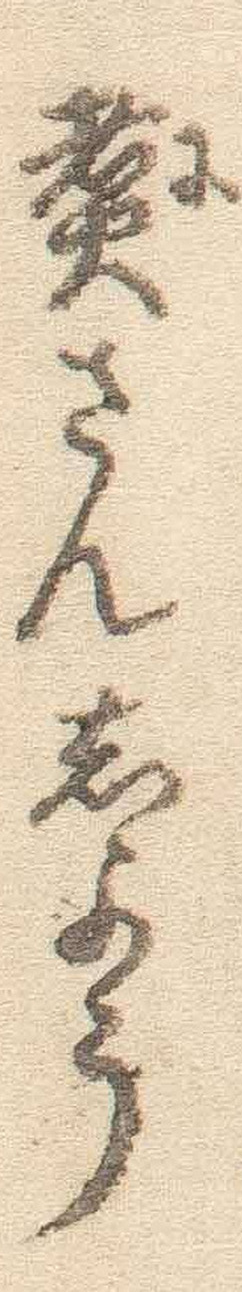煮さんしよう

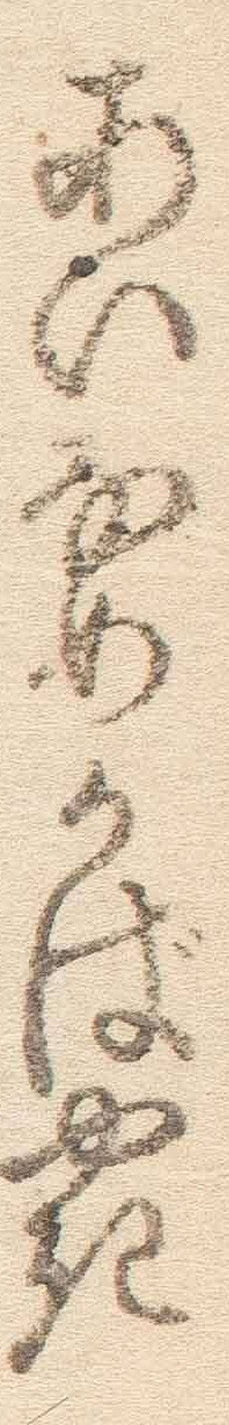あいなめかはやき
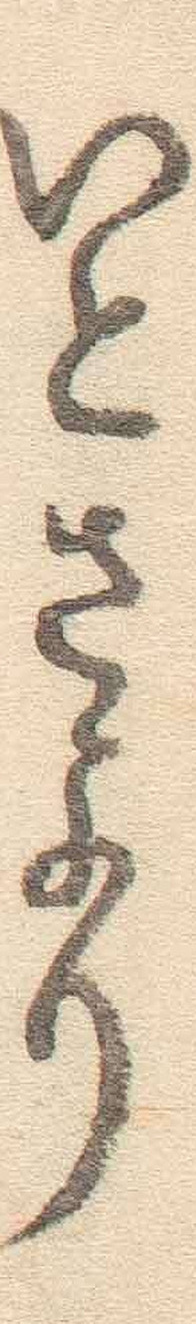いとさより
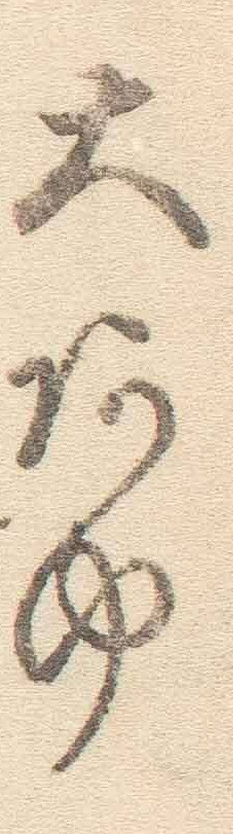大あゆ
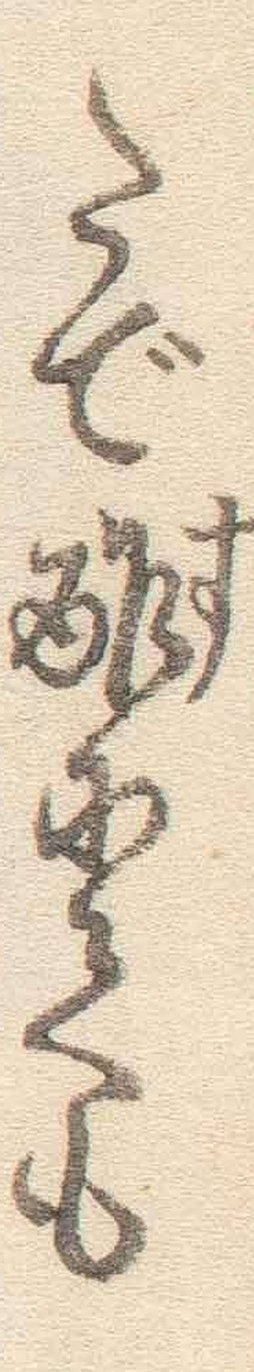たで酢にても
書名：料理通
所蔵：東京学芸大学附属図書館 国文学研究資料館
